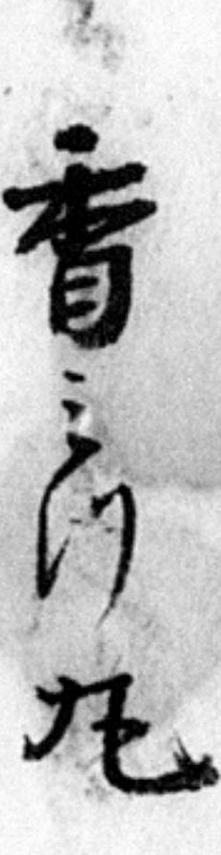香みつ丸
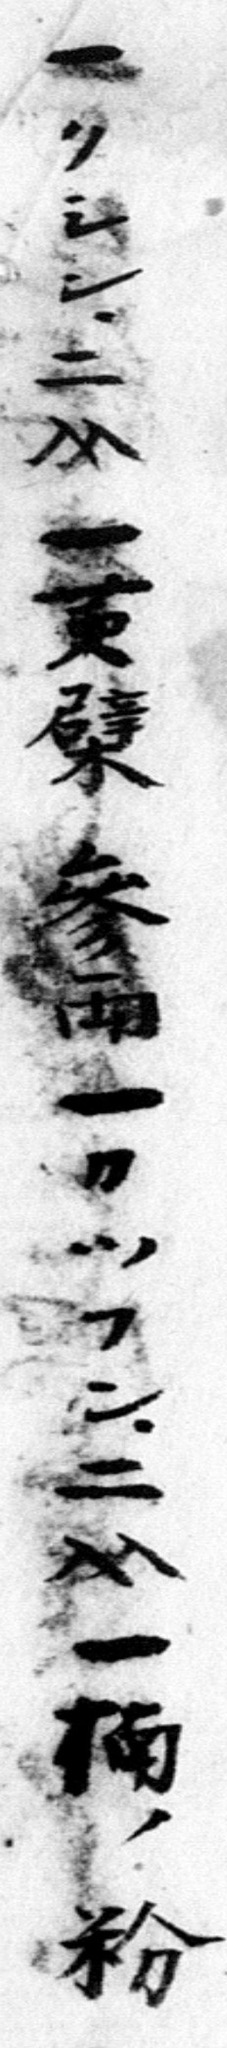一くしん二両一黄檗参両一かつふん二両一楠の粉

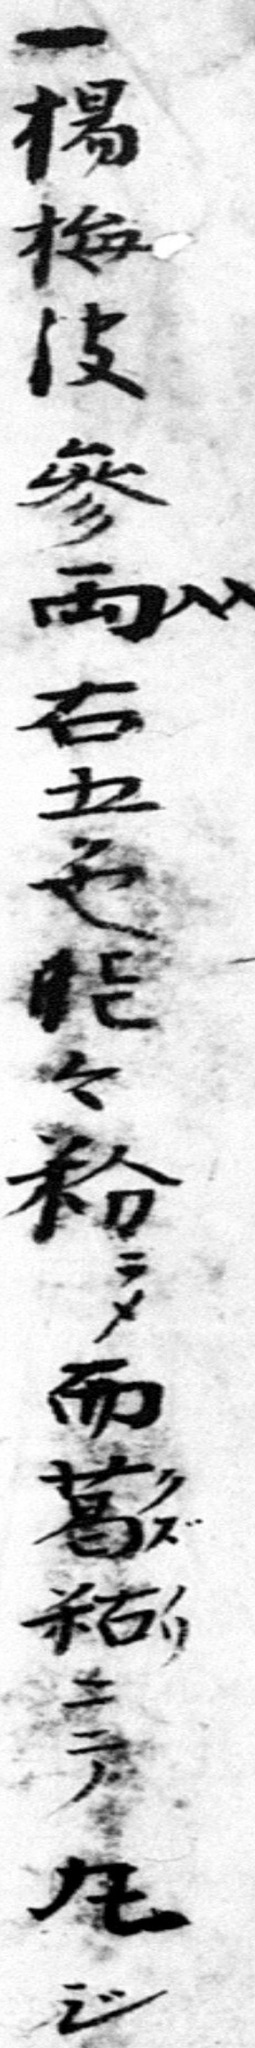一楊梅皮参両右五色能々粉にして而葛粘にて丸じ
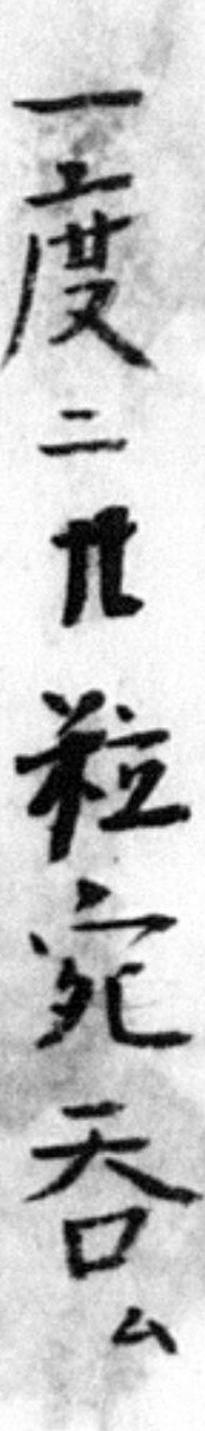一度に廿粒宛呑む
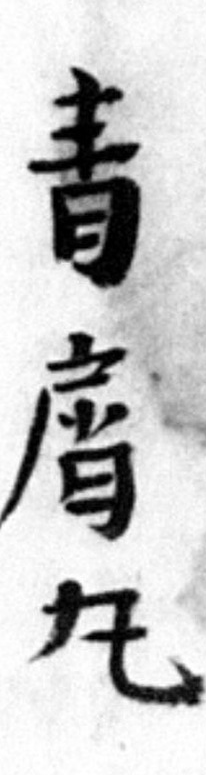青屑丸
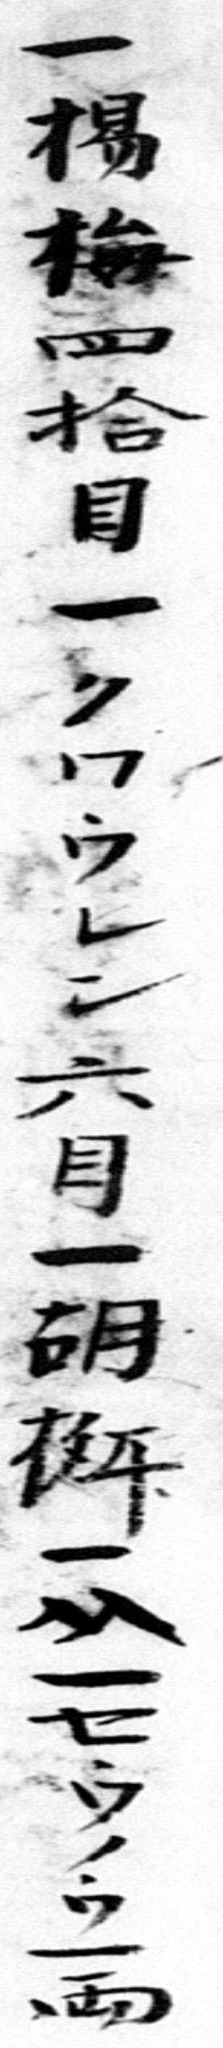一楊梅四拾目一くわうれん六目一胡椒一両一せうのう一両
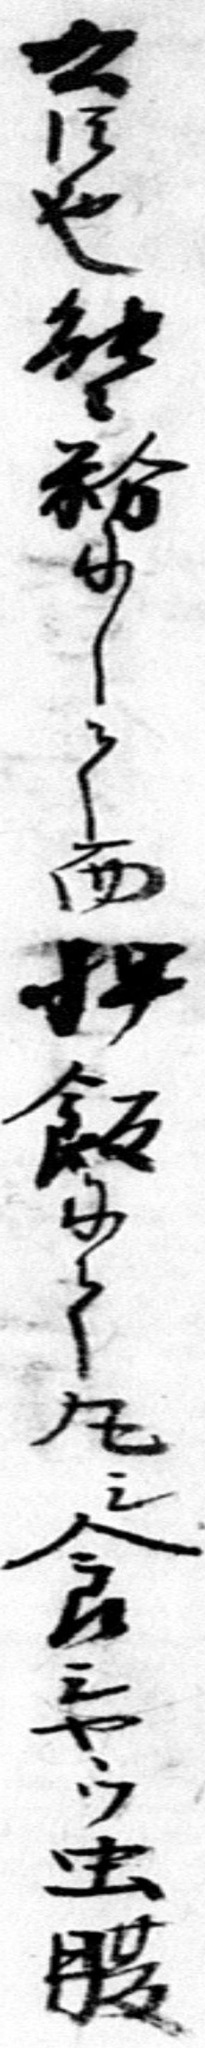右四色能々粉にして而押飯にて丸し食しやう虫腹
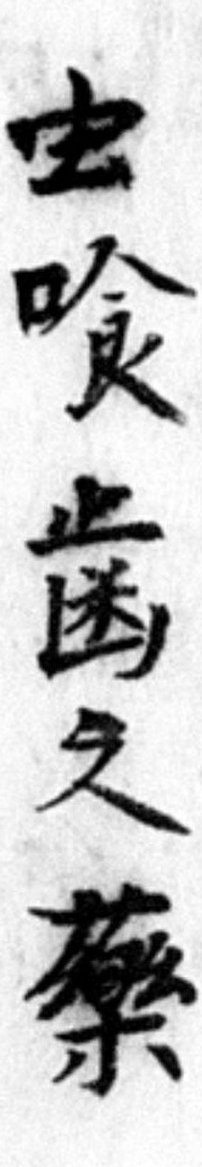虫喰歯之薬
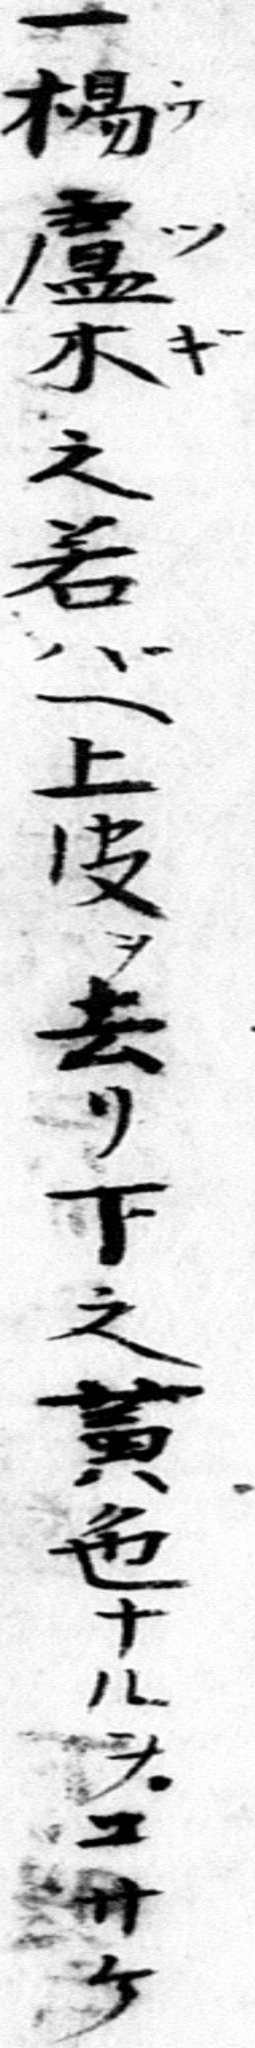一楊盧木之若はへ上皮を去り下の黄色なるをこさけ
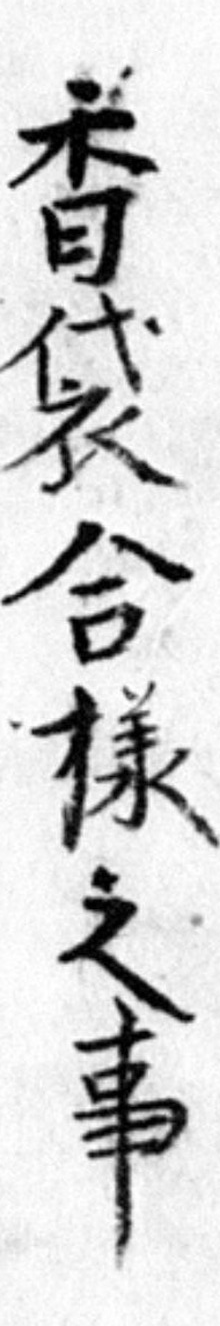香袋合様之事
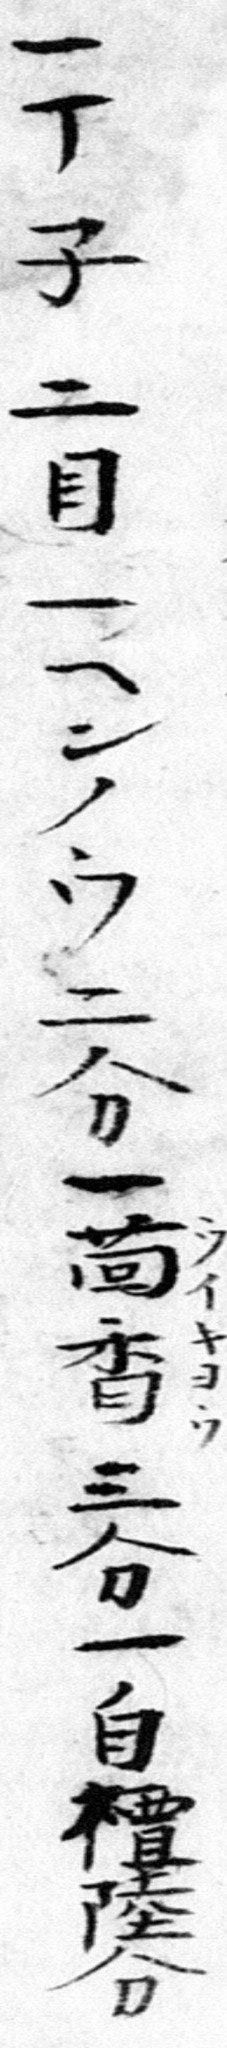一丁子二目一へんのう二分一茴香三分一自檀陸分
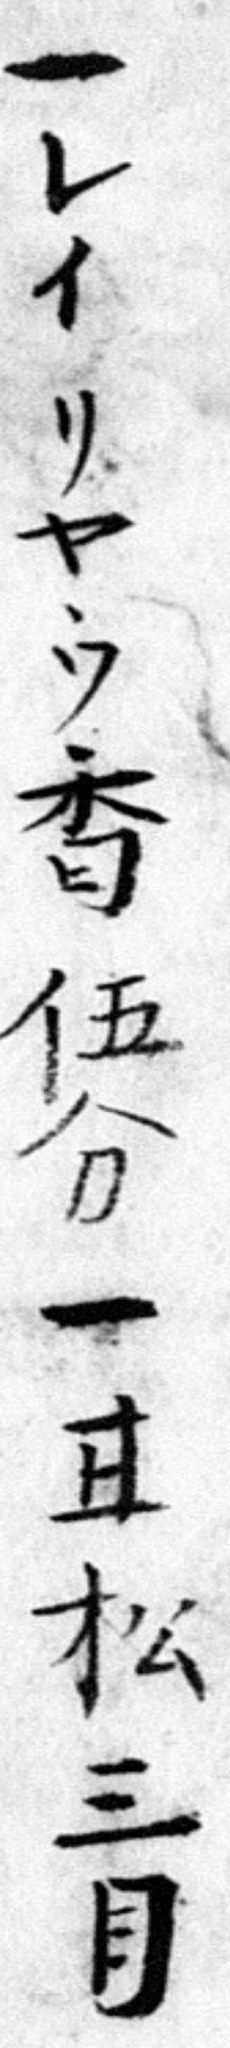一れいりやう香伍分一甘松三目
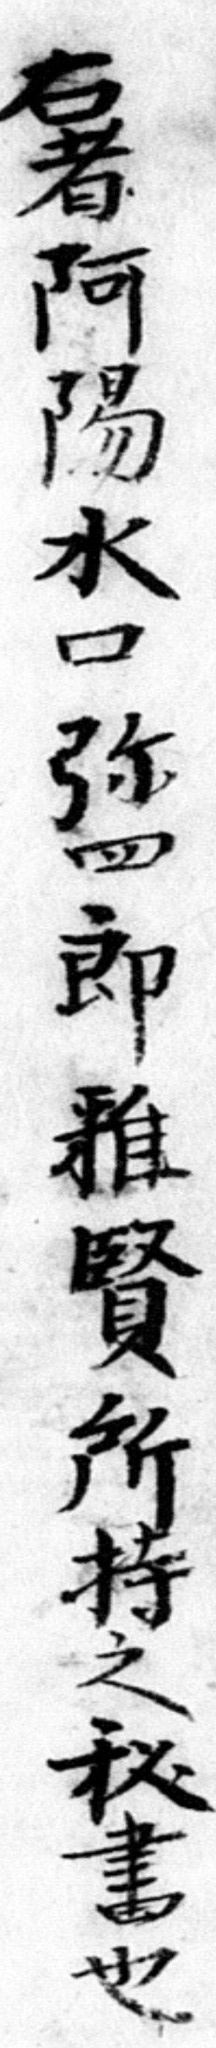右は阿陽水口弥四郎雅賢所持之秘書也
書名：名薬秘伝之書
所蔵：徳島県立図書館
